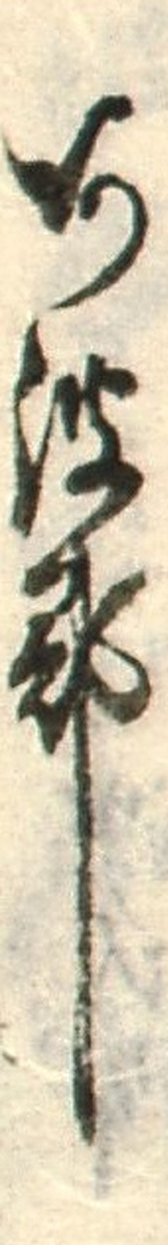阿波郡
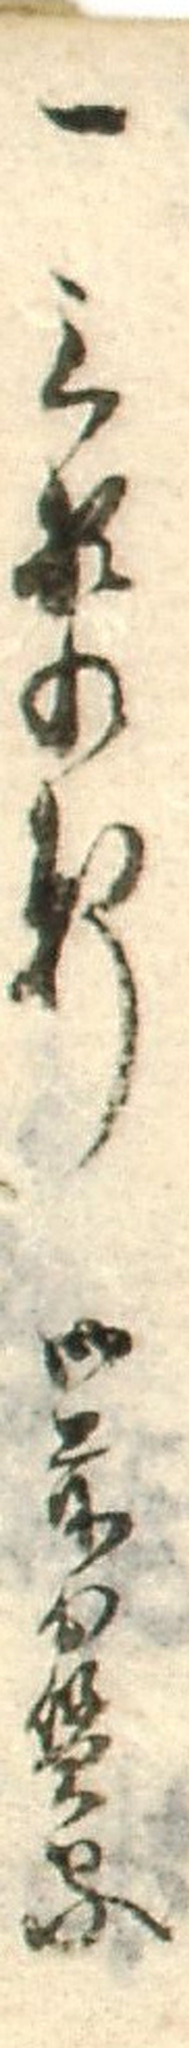一三十九軒以前より質家
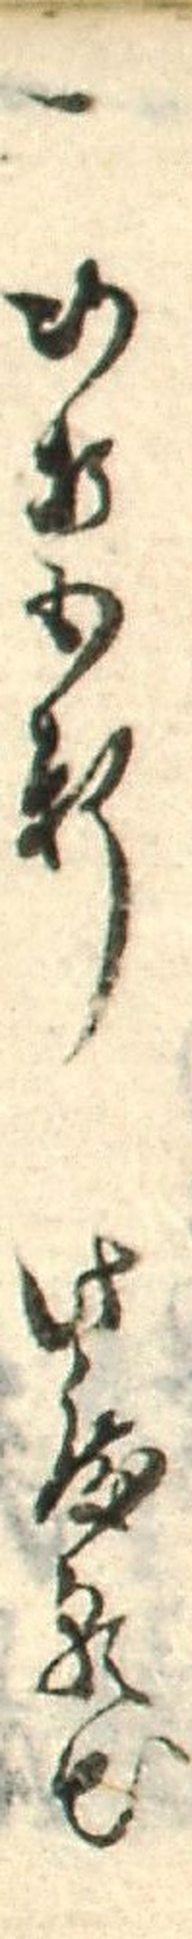一二十五軒此度願出
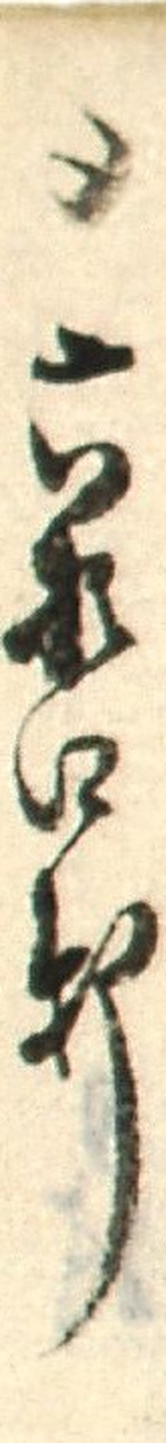〆六十四軒
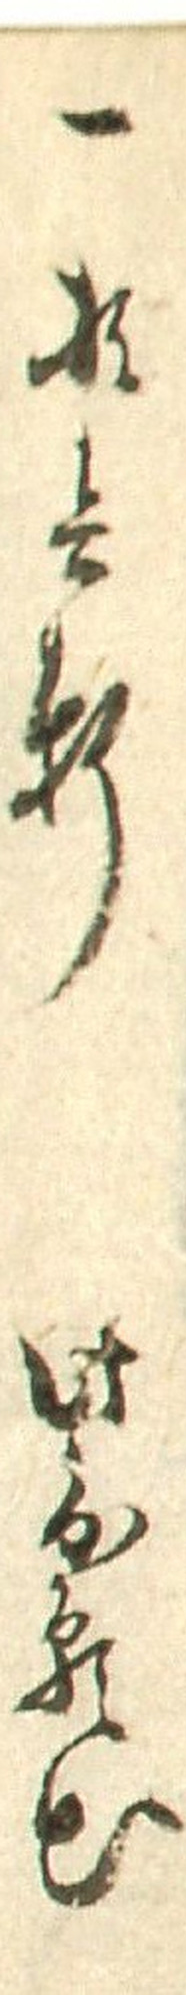一十六軒此度願出

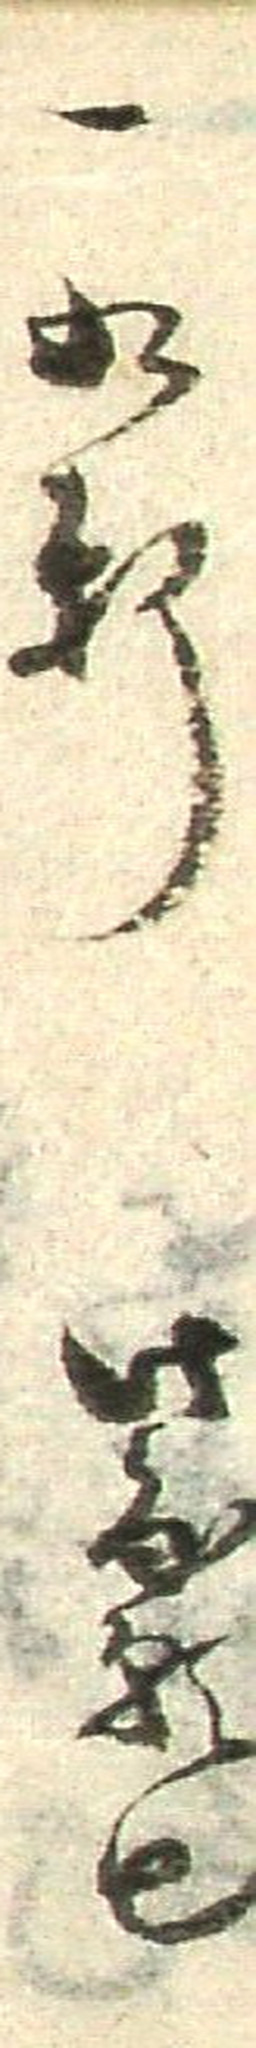一二軒此度願出
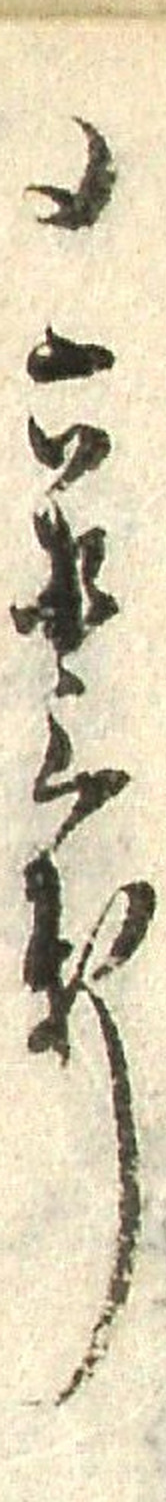〆七十三軒
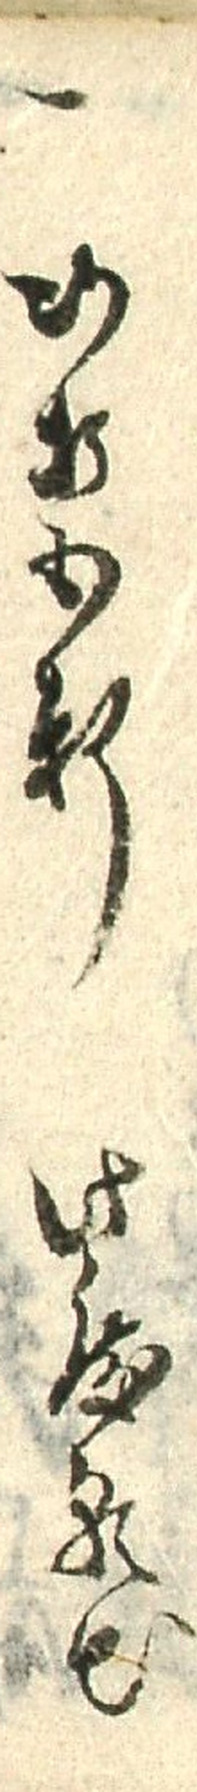一十五軒此度願出
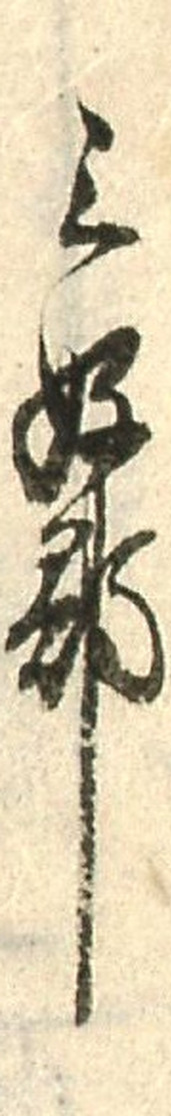三好郡
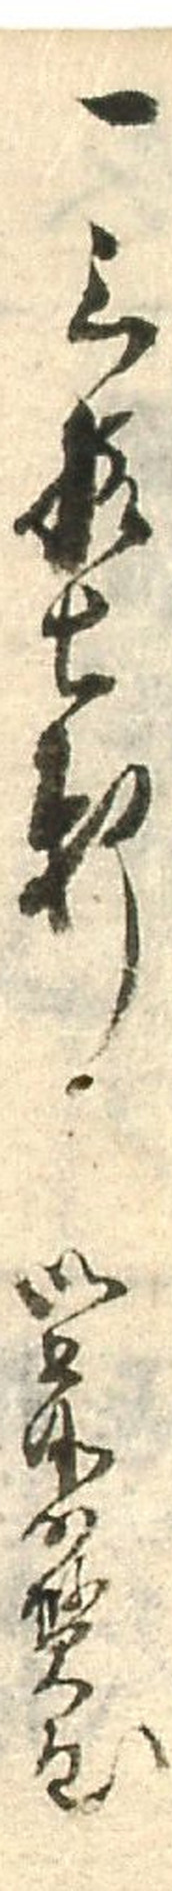一三十七軒以前より質屋
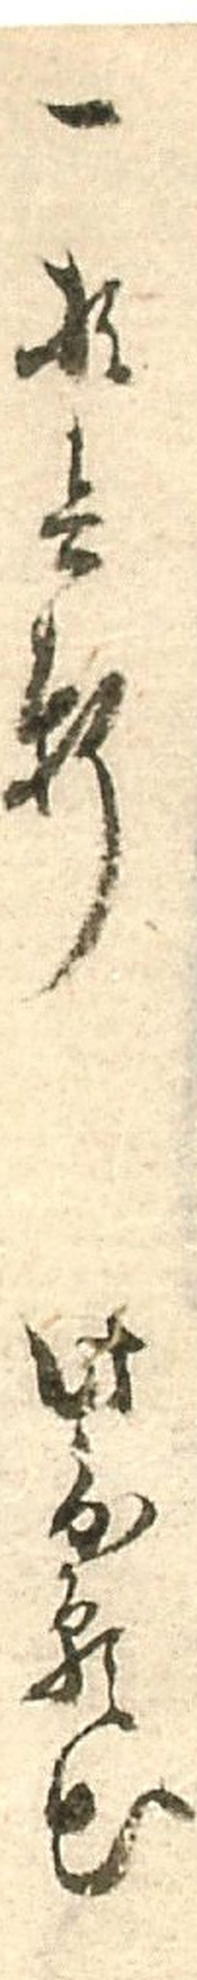一十一軒此度願出
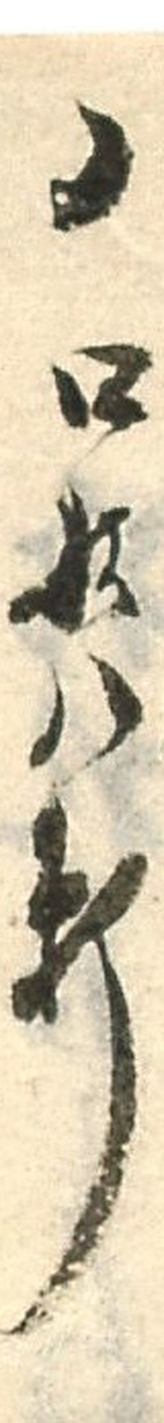〆四十八軒
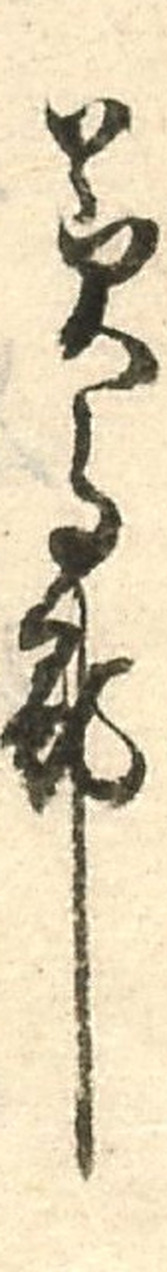美馬郡
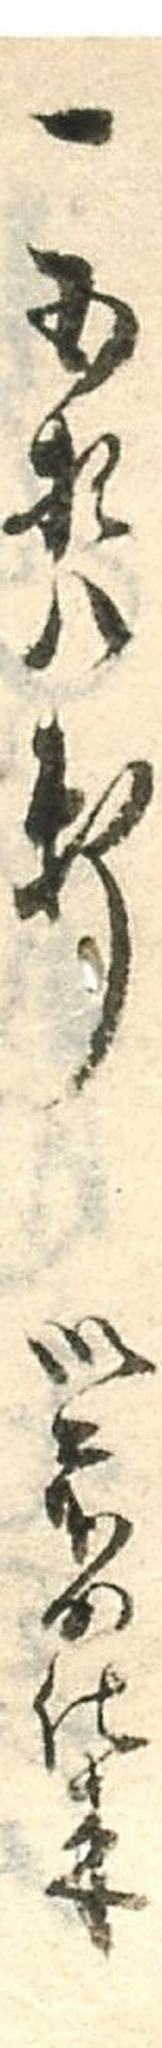一五十八軒以前より仕来
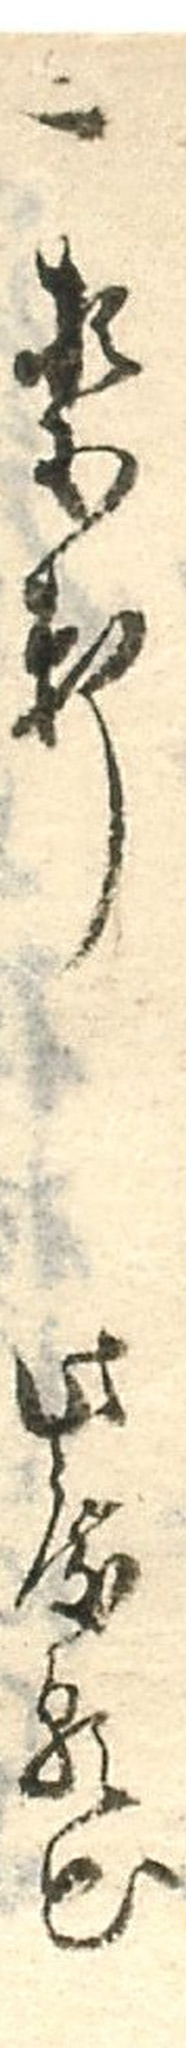一十五軒此度願出
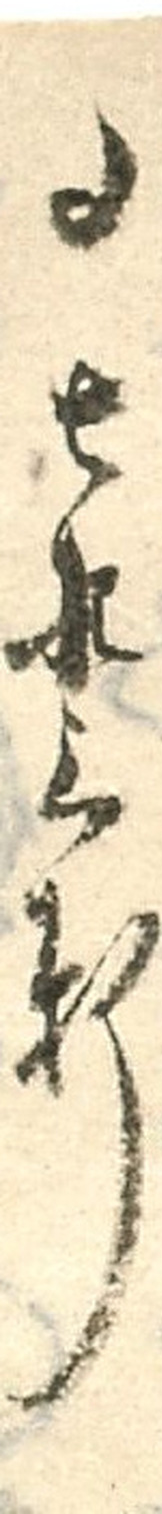〆七十三軒
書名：郷酒株絞油株質屋株御取窮郡中名面帳並諸郡株数相改帳
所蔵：鳴門教育大学 Naruto University of Education
